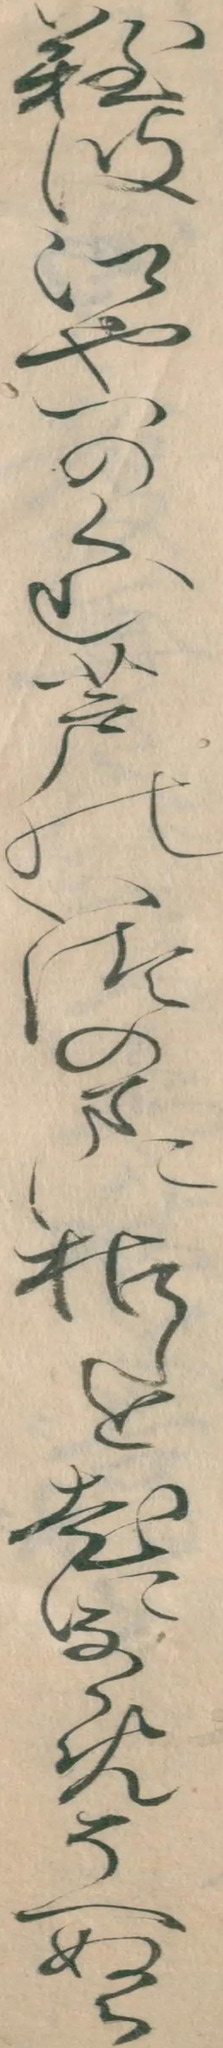〽難波江やつのくむ芦のいつのまに枯しと老になかめそへぬる
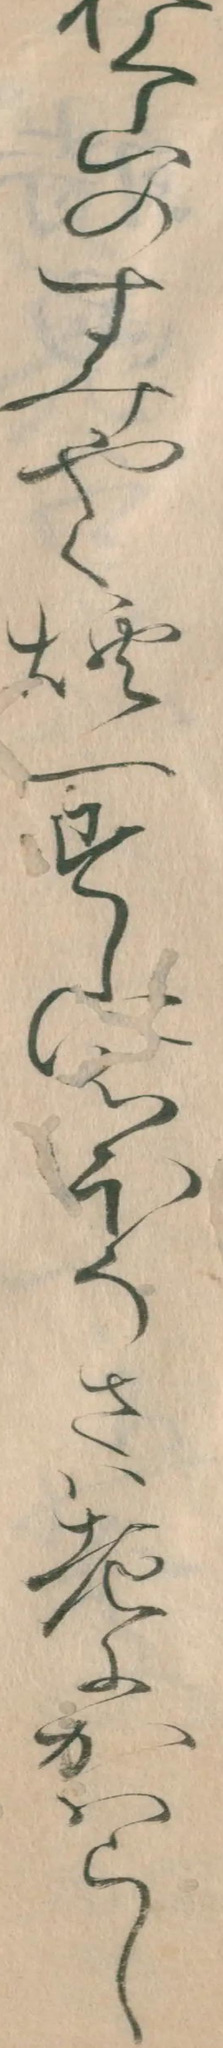〽おく山のすみやく煙一すしにほさは老にかはらし
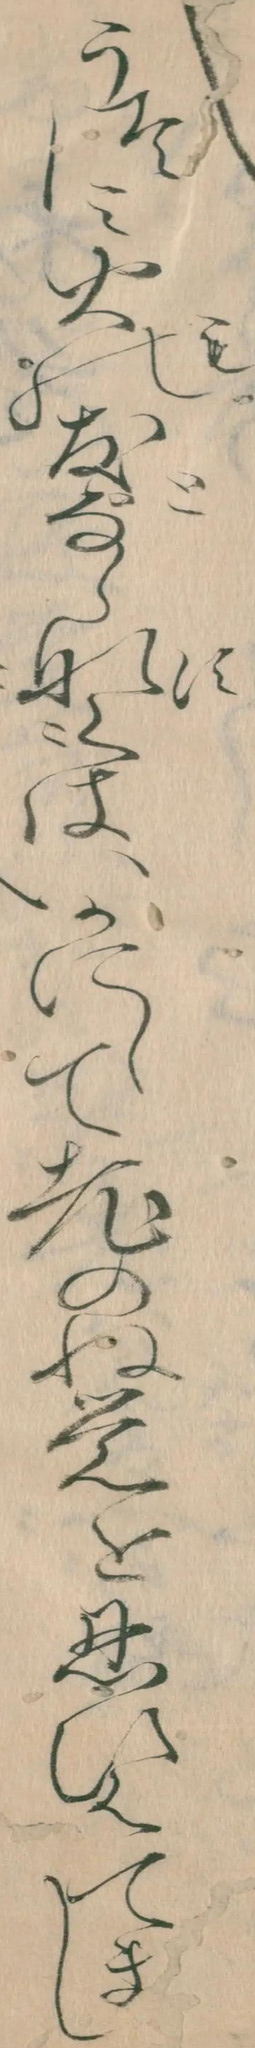〽うつみ火のも友・ならなくすはいかにして老のね覚を忍ひはてまし
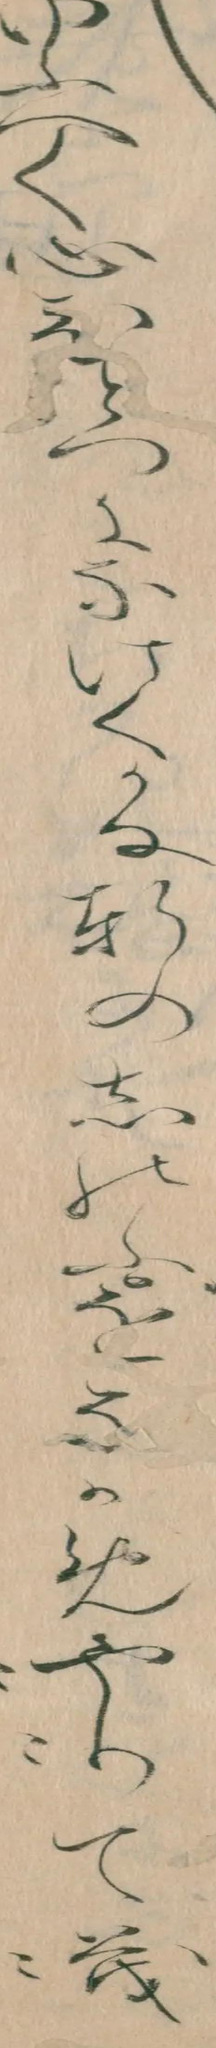〽ゆふへく心引れつはなけくかな軒のしのふ・をうかめやのても
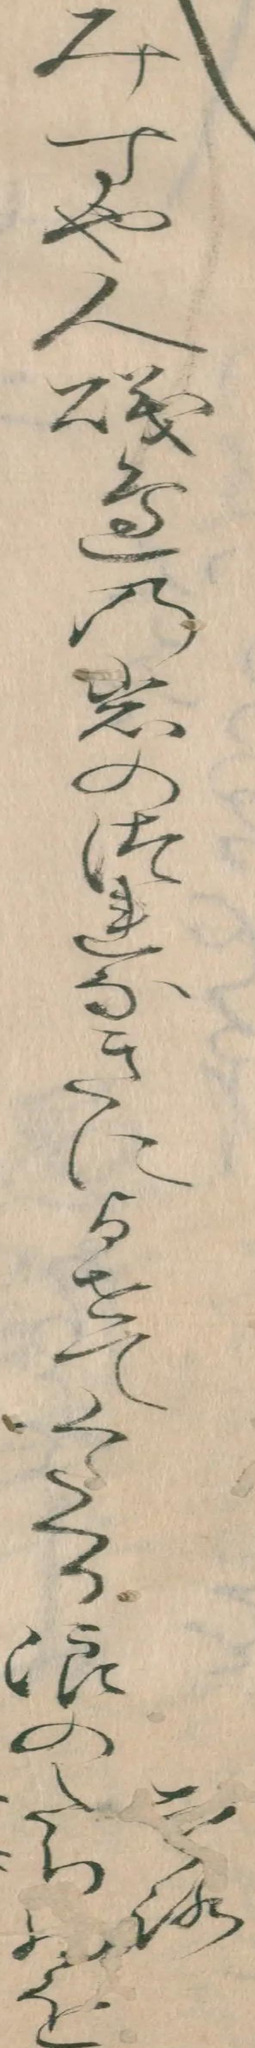〽みすや人磯辺の岩のつれなきによをてくたつか浪のたらぬ路を
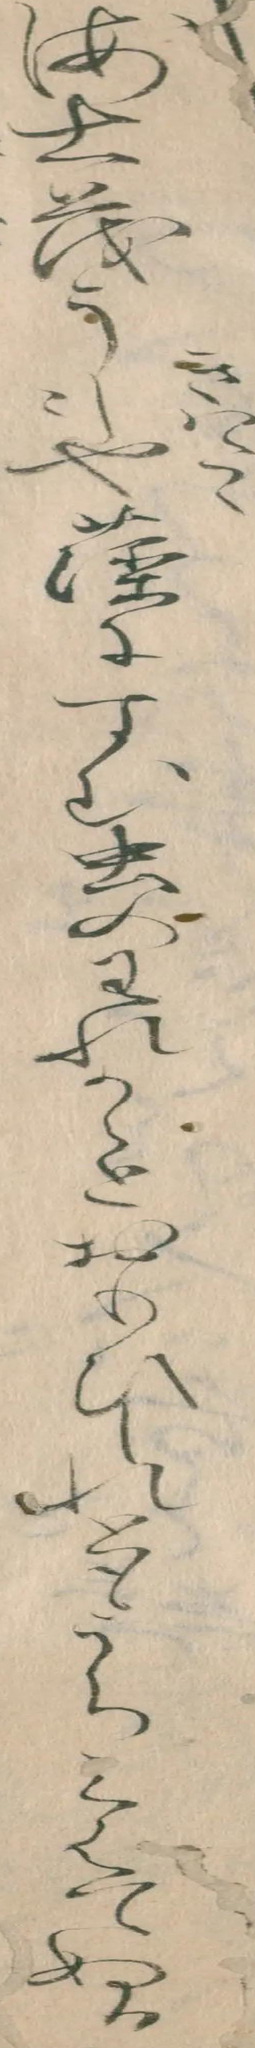〽海士もう・しや藻にすむ虫のわれかくとおもひしれともうらみはてぬる
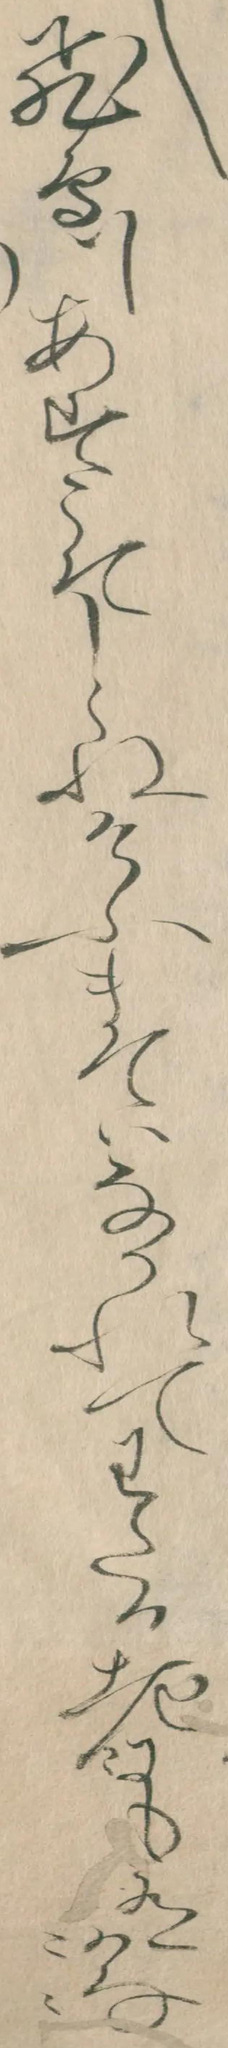〽飛鳥川あすこそしらねけふまてはなかれてわたる老にの月日も有かな

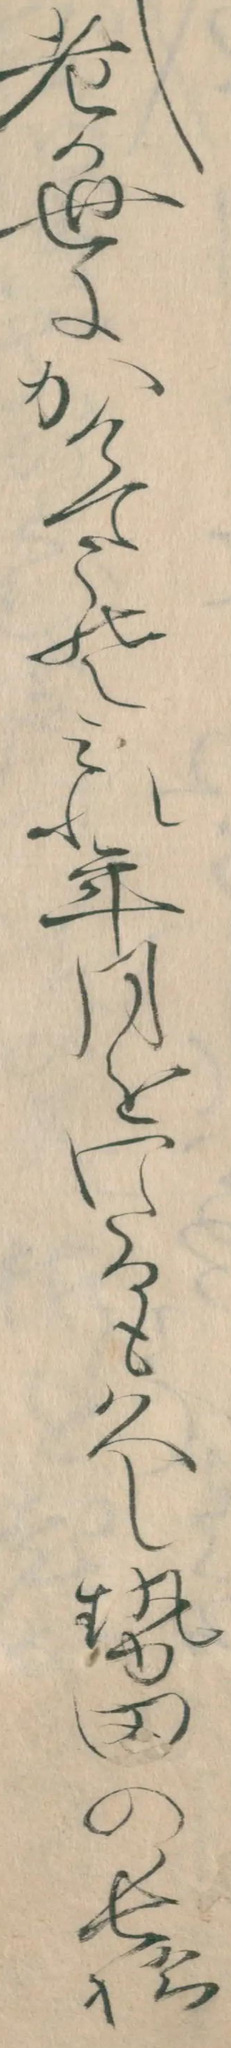〽老の世にかけてこそみれ年月をわたるも久し勢田の長橋
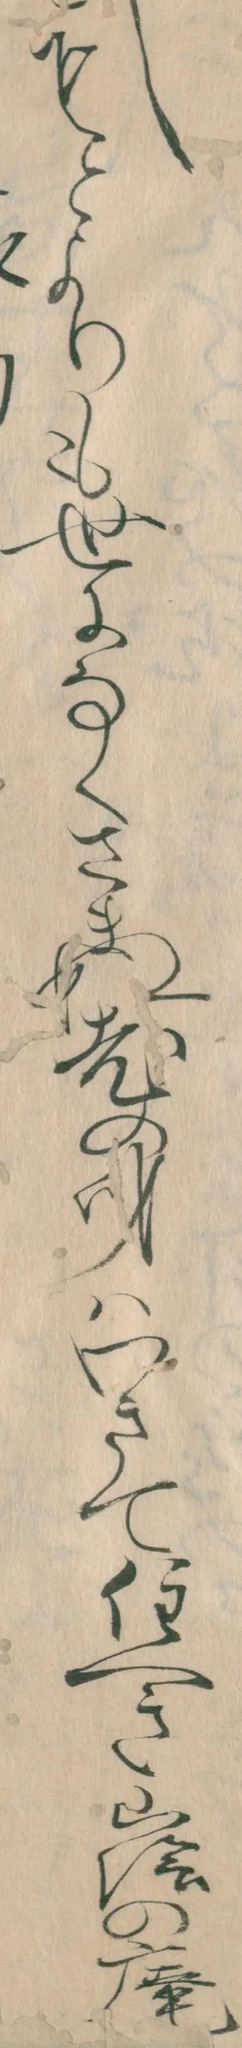〽もとよりも世になくさまぬ老の身はわきて住へき山陰の庵
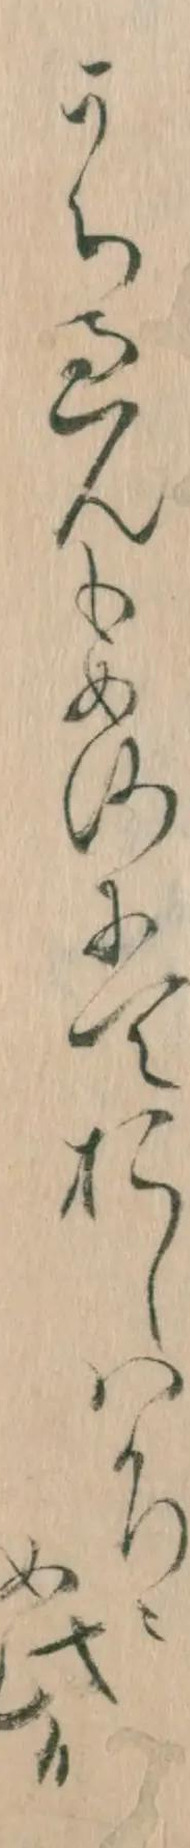うち過んも如何にておしはかりて
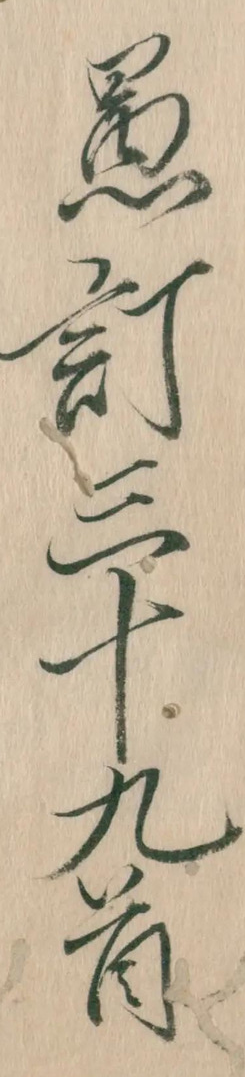愚訂三十九首

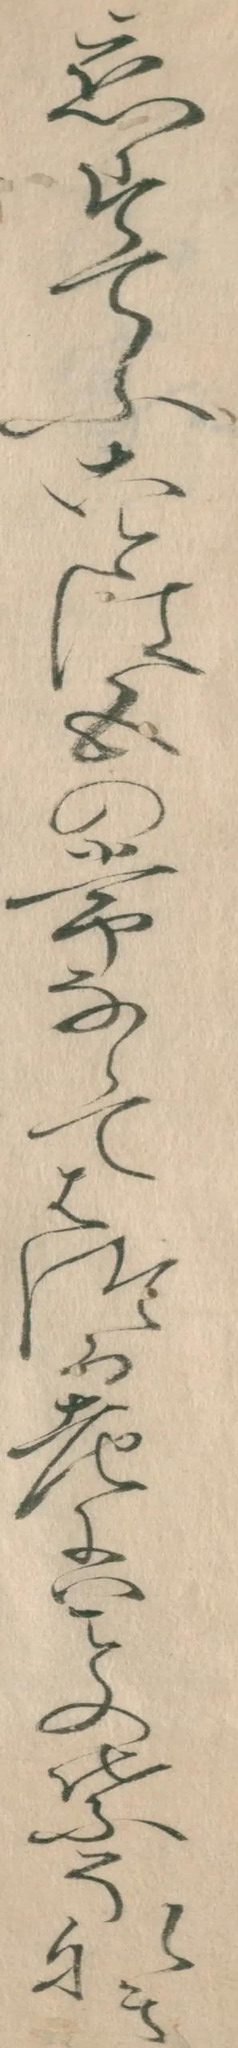恋すてふことは五の常ならてはつか老にはことの葉うな其
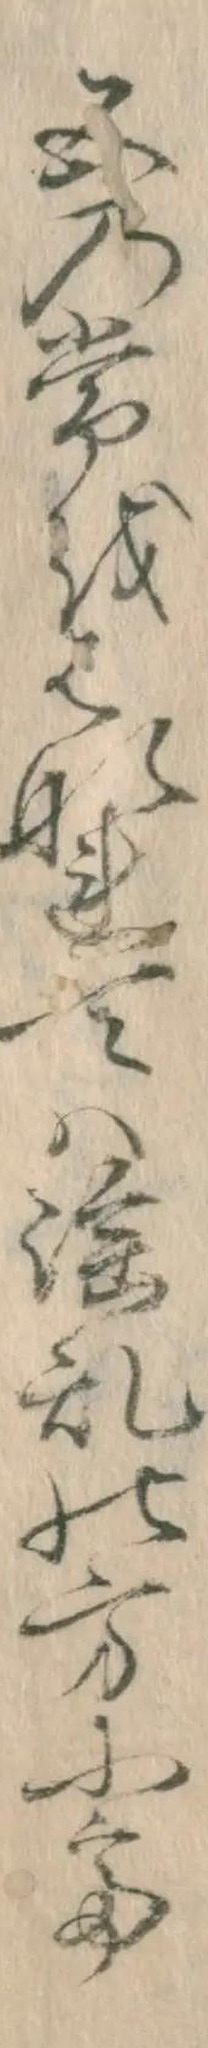五の常をはなれては乱の方に
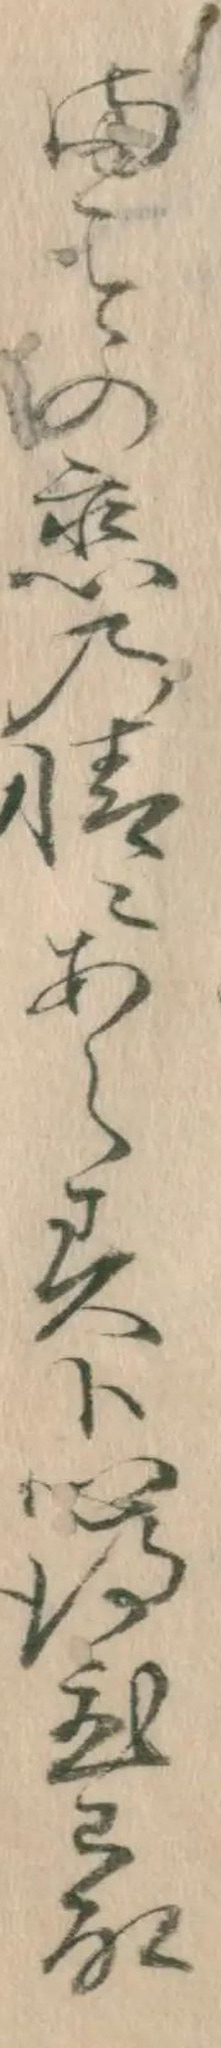まことの恋の情にあらすと心得飛己紅

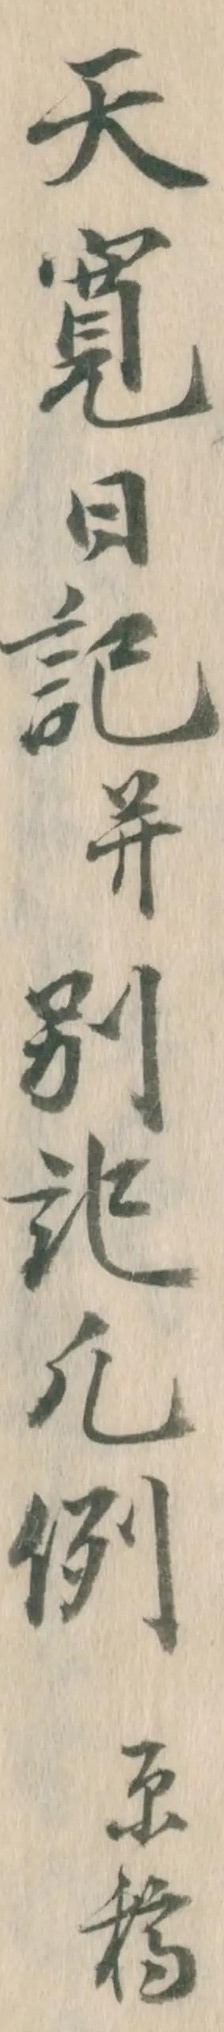天寛日記并別記凡例原稿

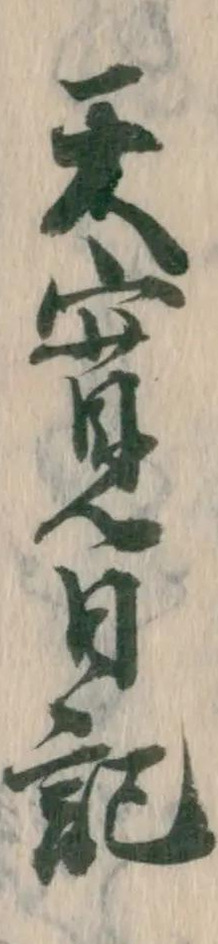天寛日記
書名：輪池叢書. 12
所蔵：国立国会図書館 National Diet Library, JAPAN
